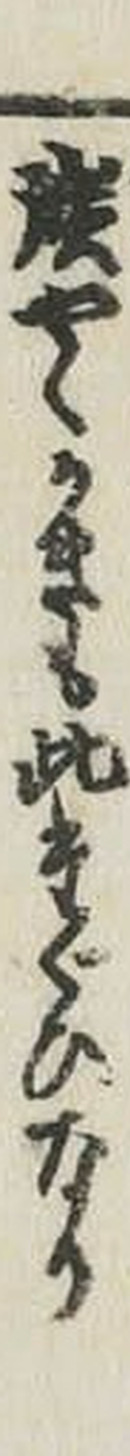炭やくかまも此たぐひなり
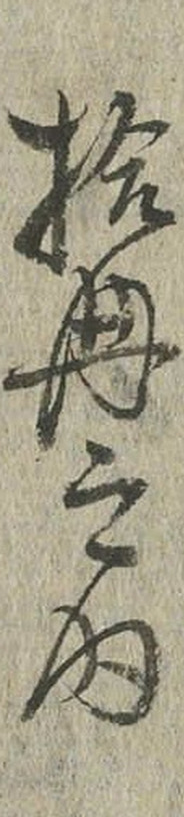拾冊之内
